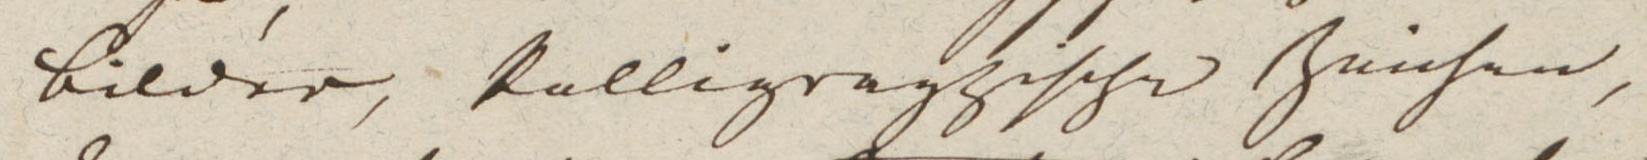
Bilder, kalligraphische Zeichen,
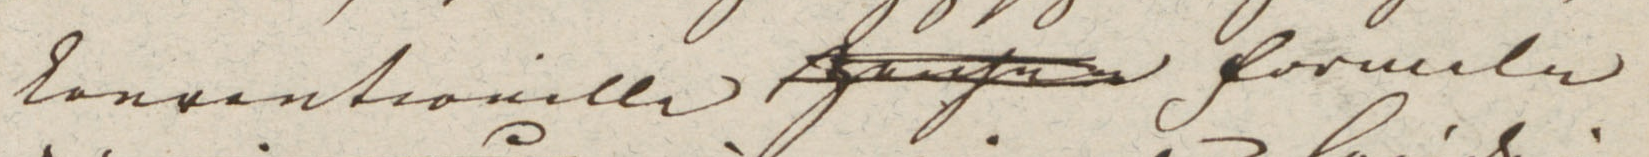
konventionelle Zeichen Formeln
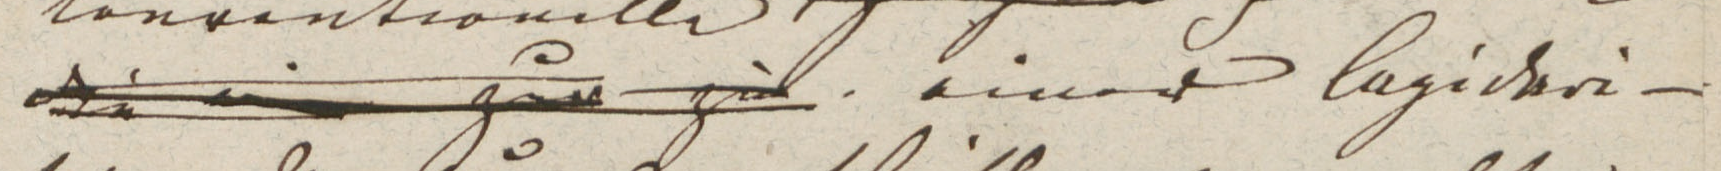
die zur zu einer lapidari-
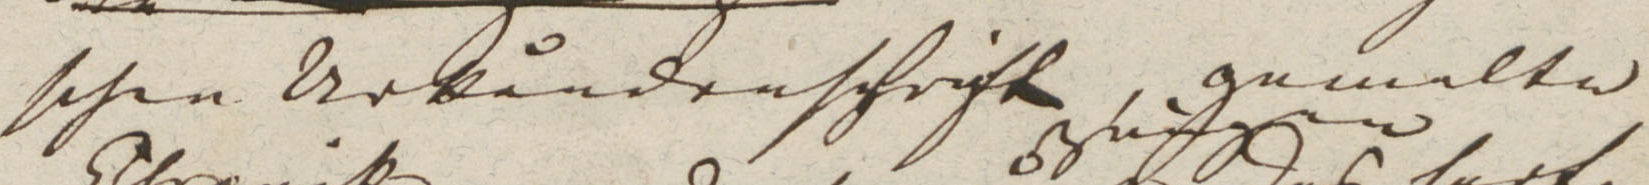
schen Urkundenschrift, gemalte
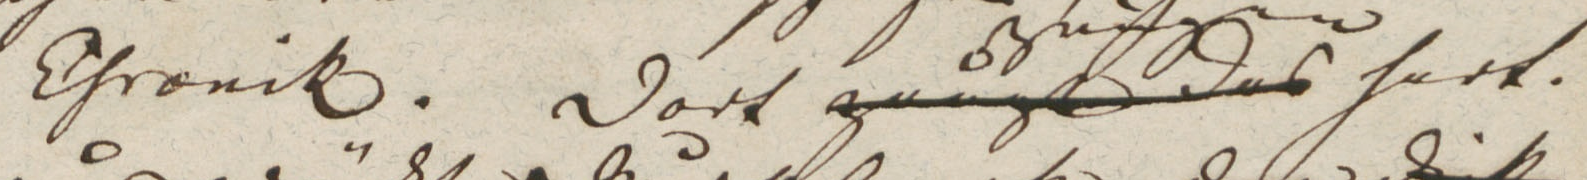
Chronik. Dort zeugt das zeugen hart
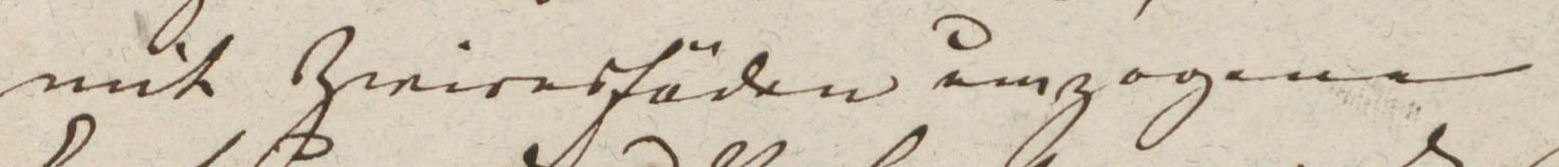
mit Zwirnsfäden umzogene
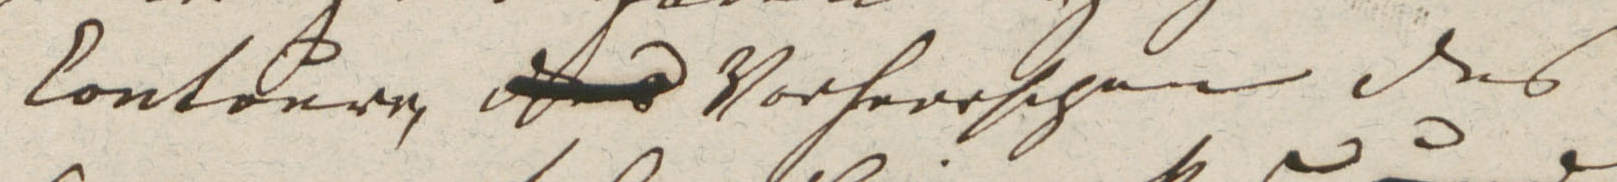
Contoure, das Vorherrschen des
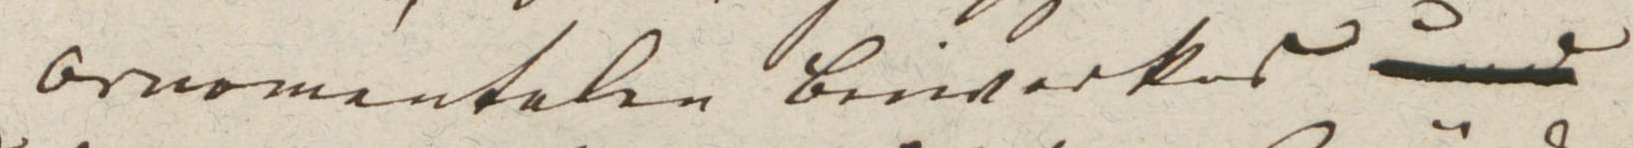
ornamentalen Beiwerkes und
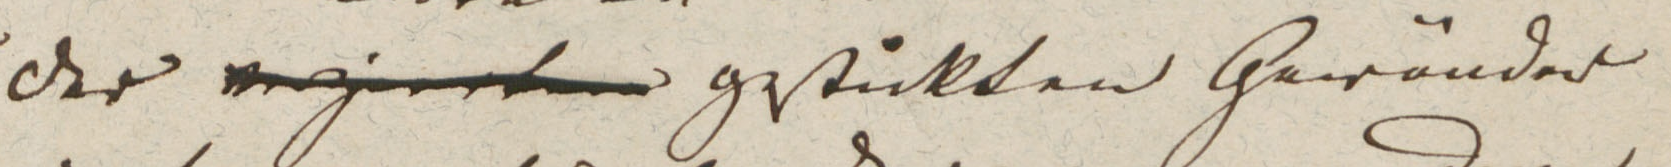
der verzierten gestickten Gewänder
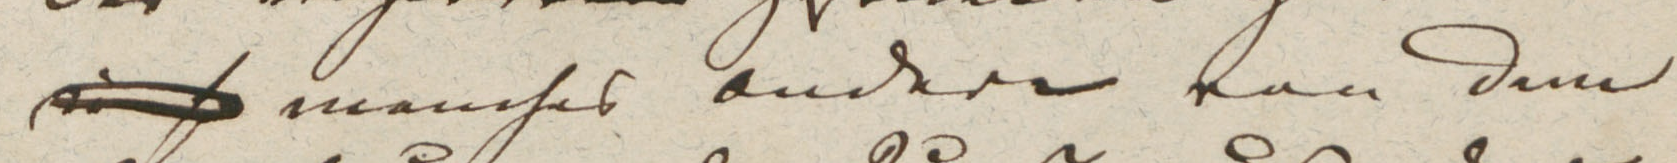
so wie so manches andere von dem
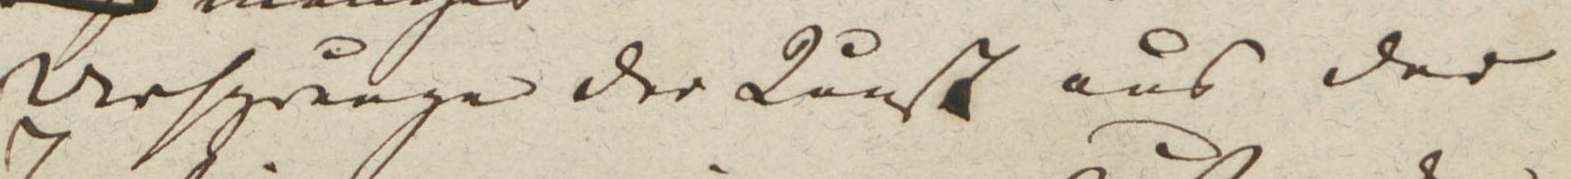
Ursprunge der Kunst aus der
